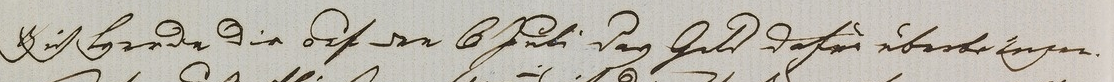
& ich werde dir auf den 6 Juli das Geld dafür überbringen.
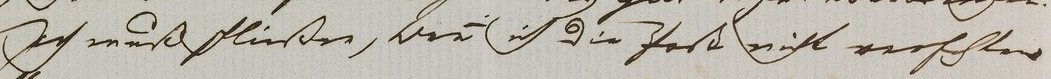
Ich muß schließen, wenn ich die Post nicht verfehlen
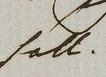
soll.
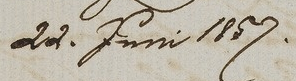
22. Juni 1857.
